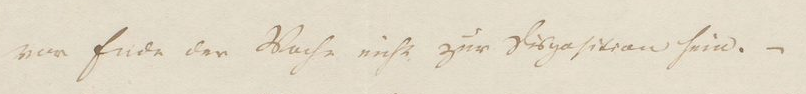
vor Ende der Woche nicht zur Disposition sein. –
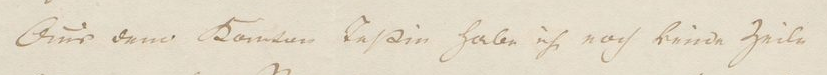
Aus dem Kanton Teßin habe ich noch keine Zeile
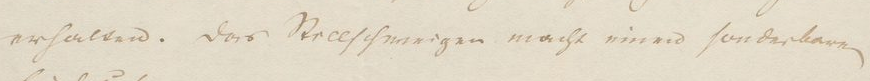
erhalten. Das Stillschweigen macht einen sonderbaren
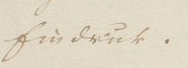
Eindruk.
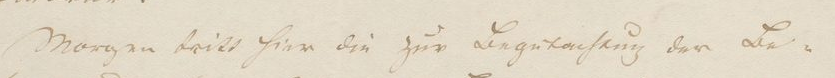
Morgen tritt hier die zur Begutachtung der Be-
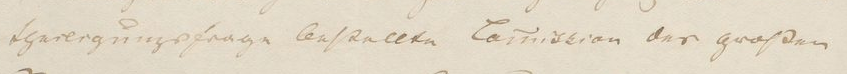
theiligungsfrage bestellte Commission des großen
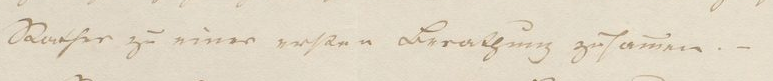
Rathes zu einer ersten Berathung zusammen. –
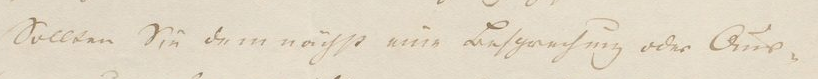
Sollten Sie demnächst eine Besprechung oder Aus-
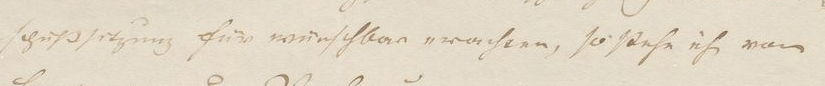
schußsitzung für wünschbar erachten, so stehe ich von
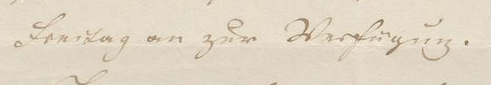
Freitag an zur Verfügung.
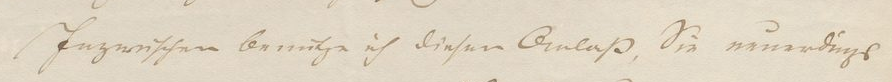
Inzwischen benutze ich diesen Anlaß, Sie neuerdings
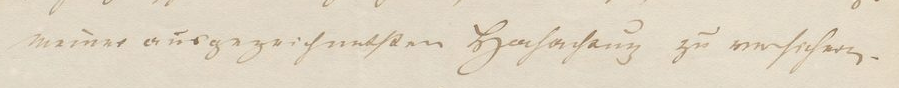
meiner ausgezeichnetsten Hochachtung zu versichern.
